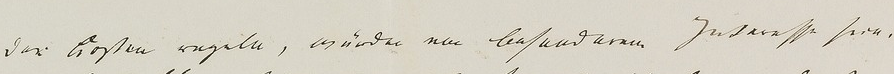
der Kosten regeln, würden von besonderem Interesse sein.
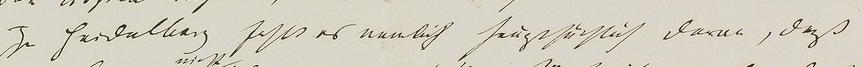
In Heidelberg fehlt es nemlich hauptsächlich daran, daß
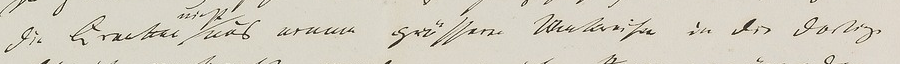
die Kranken nicht aus einem grösseren Umkreise in die dortige
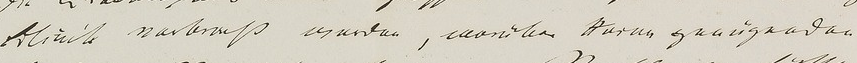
Klinik verbracht werden, worüber keine genügenden
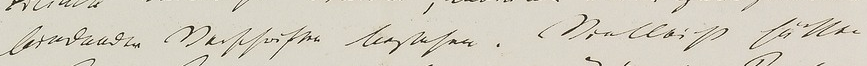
bindenden Vorschriften bestehen. Vielleicht hätten
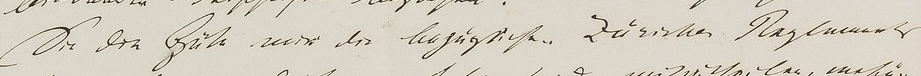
Sie die Güte mir die bezüglichen Züricher Reglements
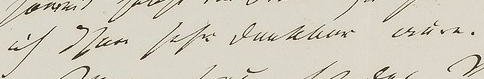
ich Ihnen sehr dankbar wäre.
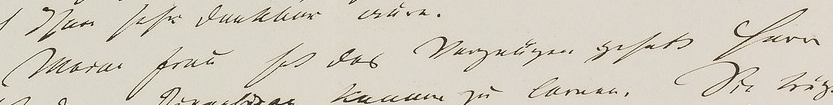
Meine Frau hat das Vergnügen gehabt Hern
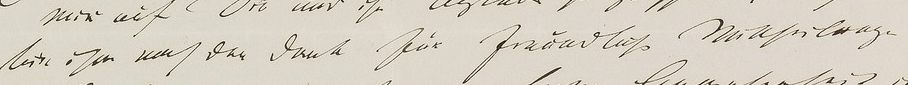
bin ihm auch den Dank für freundliche Mittheilungen
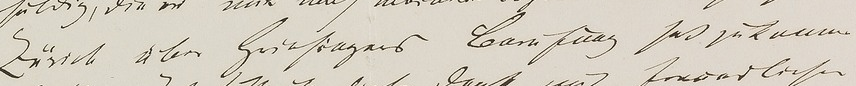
Zürich über Griesingers Berufung hat zukomen
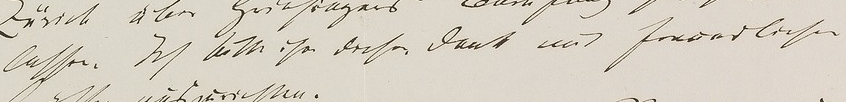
lassen. Ich bitte ihm diesen Dank mit freundlichen
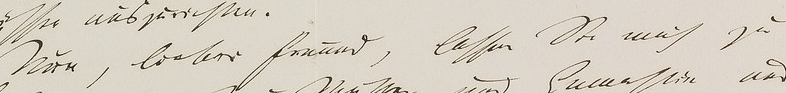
Nun, lieber Freund, lassen Sie mich zu
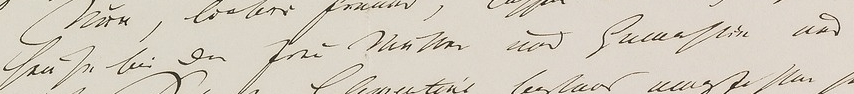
Hause bei der Frau Mutter und Gemahlin und
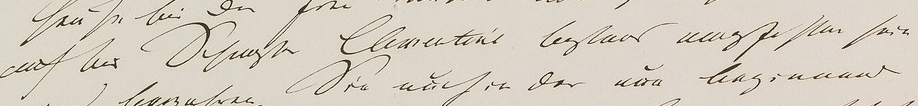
auch bei Schwester Clementine bestens empfohlen sein
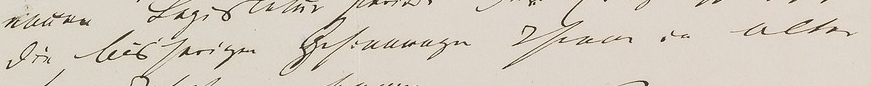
die bisherigen Gesinnungen Ihres in alter
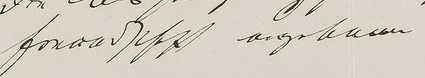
Freundschaft ergebenen
